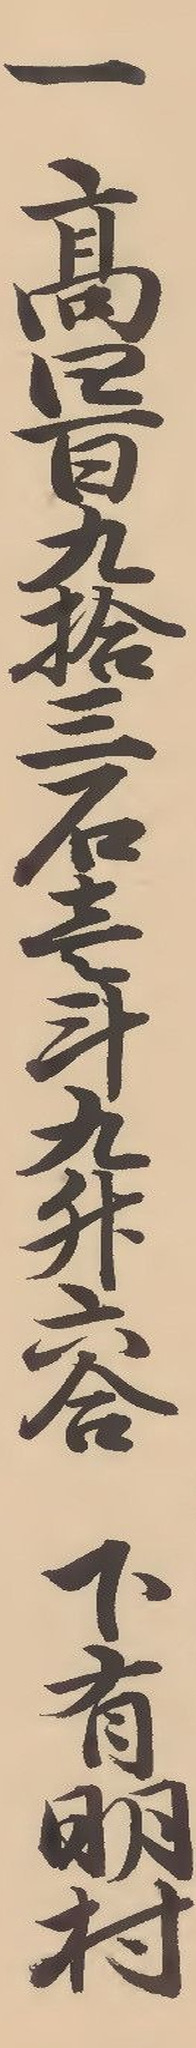一高四百九拾三石壱斗九升六合下有明村
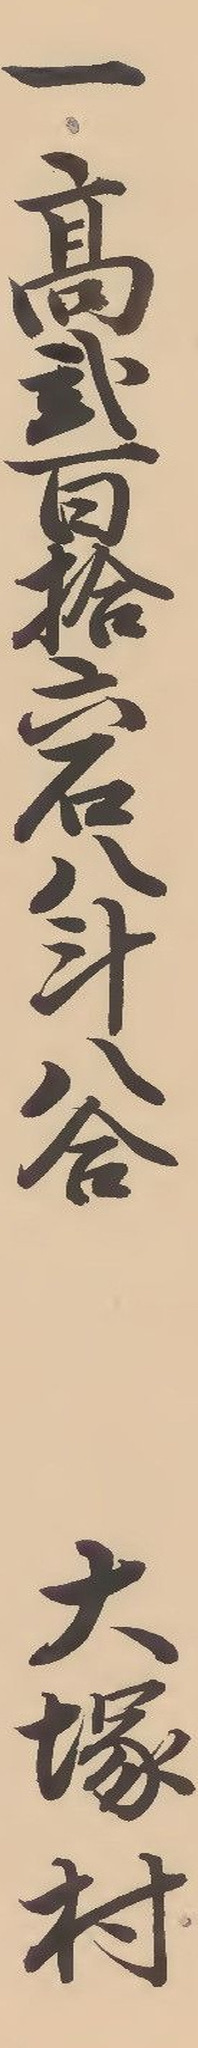一高弐百拾六石八斗八合大塚村
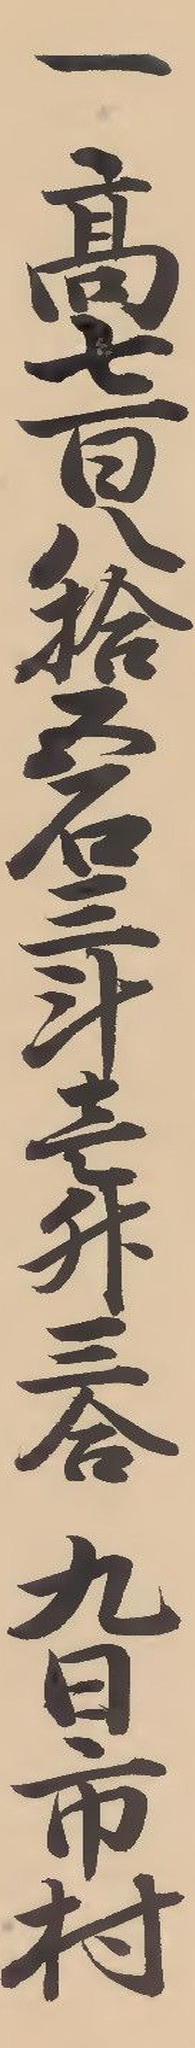一高七百八拾五石三斗壱升三合九日市村
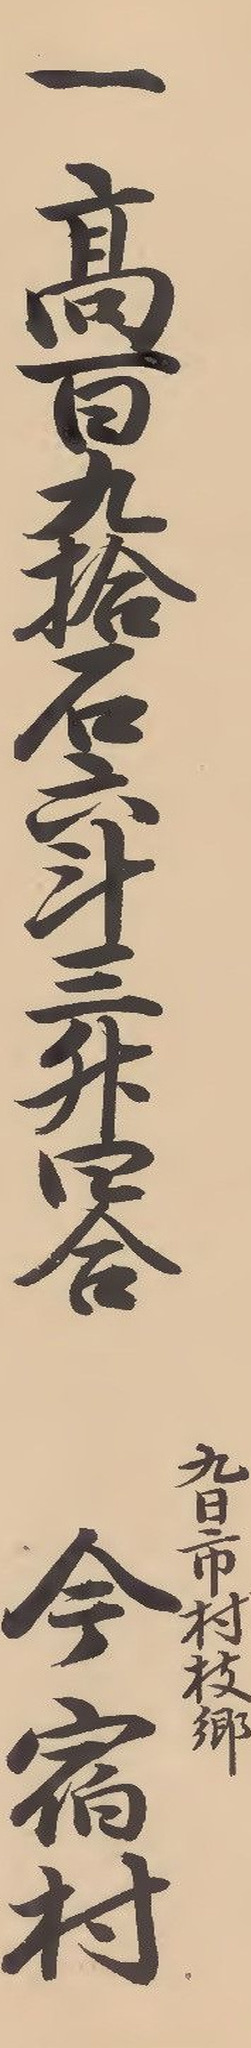一高百九拾石六斗三升四合今宿村
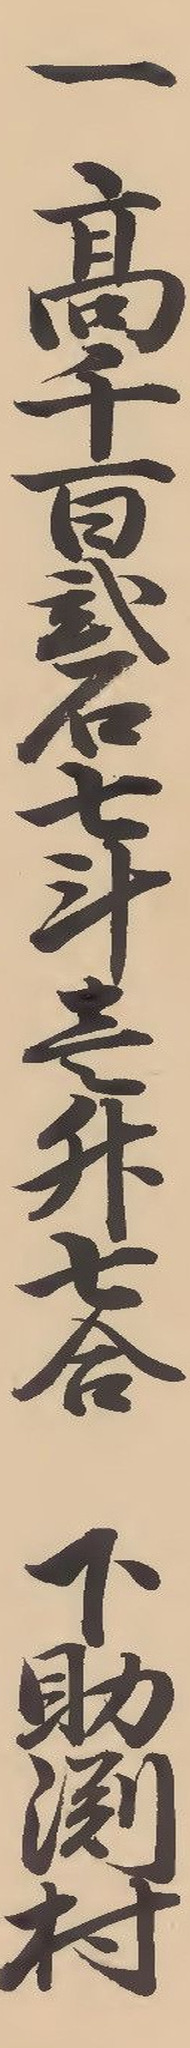一高千百弐石七斗壱升七合下助淵村
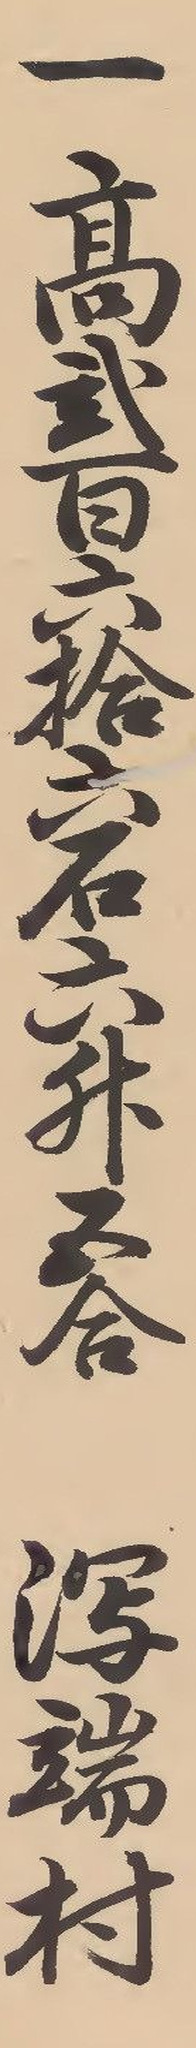一高弐百六拾六石六升五合潟端村

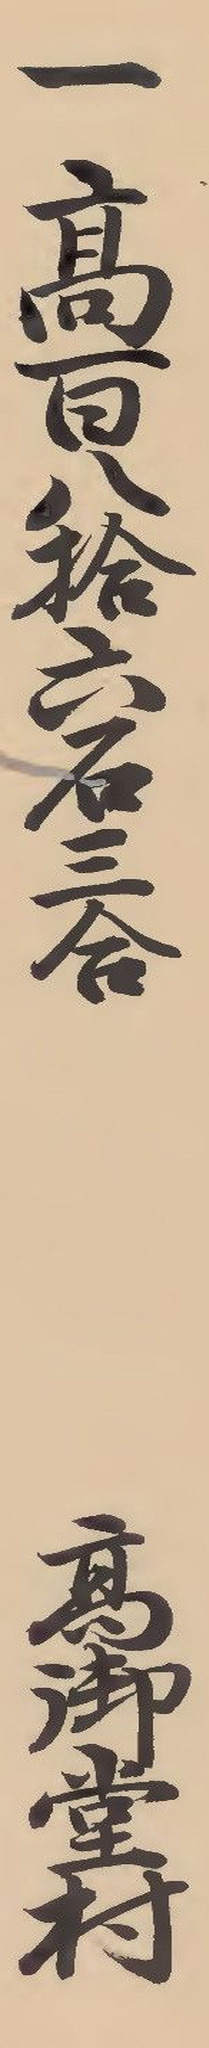一高百八拾六石三合高御堂村
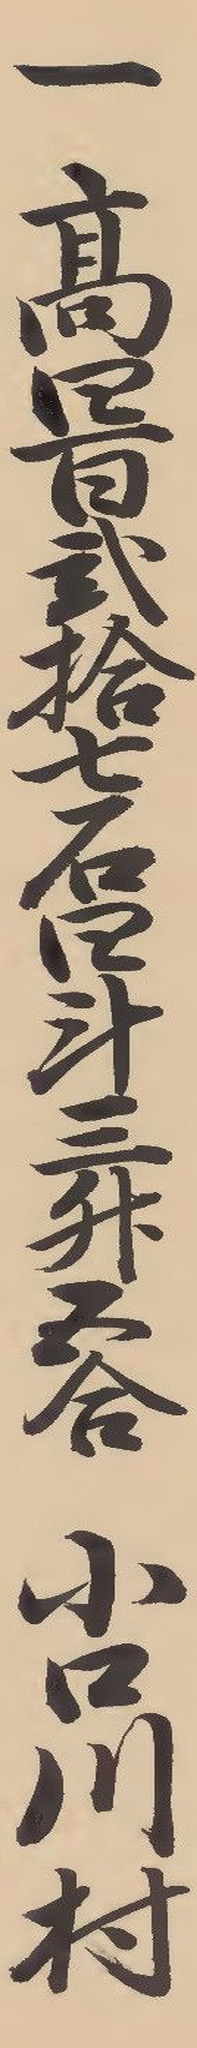一高四百弐拾七石四斗三升五合小口川村
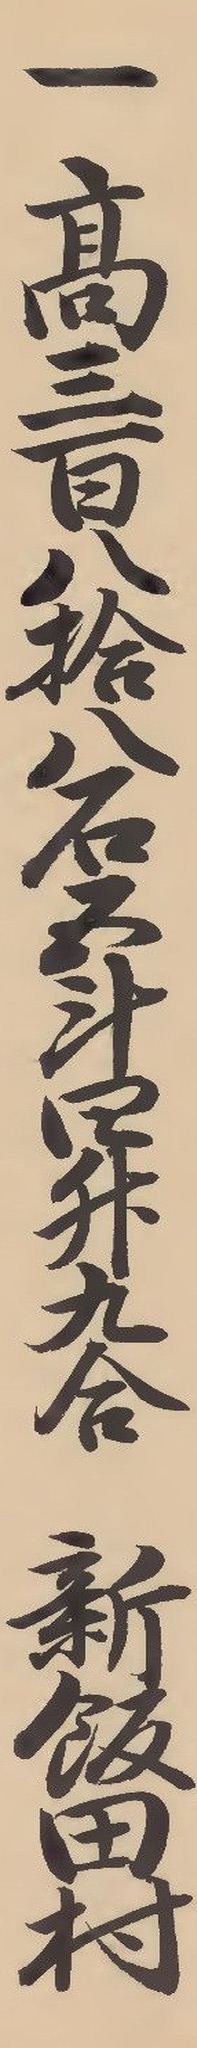一高三百八拾八石五斗四升九合新飯田村
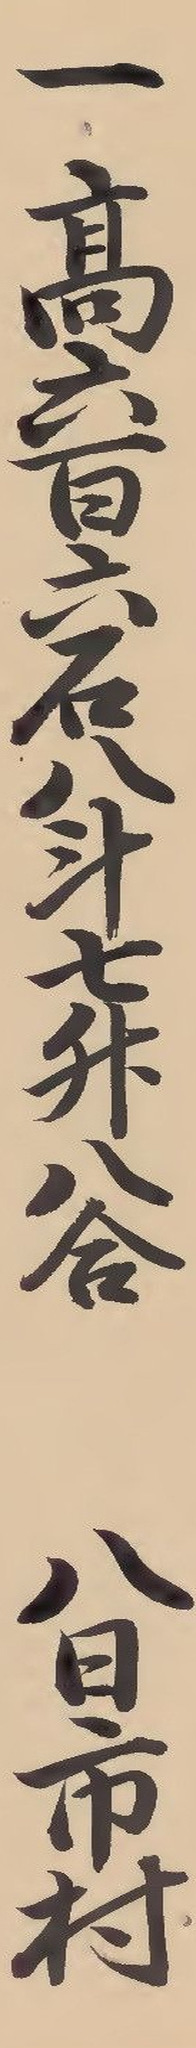一高六百六石八斗七升八合八日市村
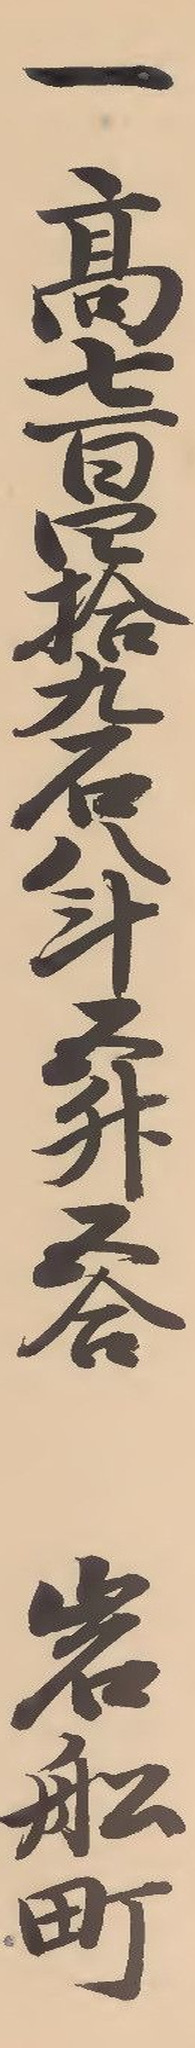一高七百四拾九石八斗五升五合岩船町
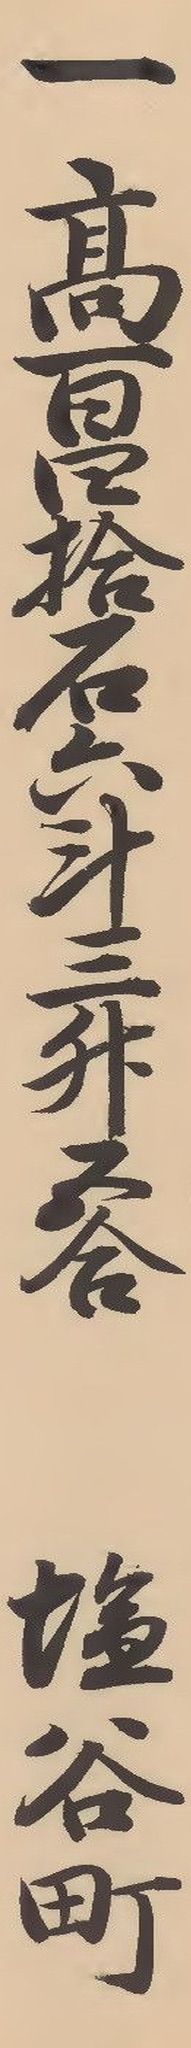一高百四拾石六斗三升五合塩谷町
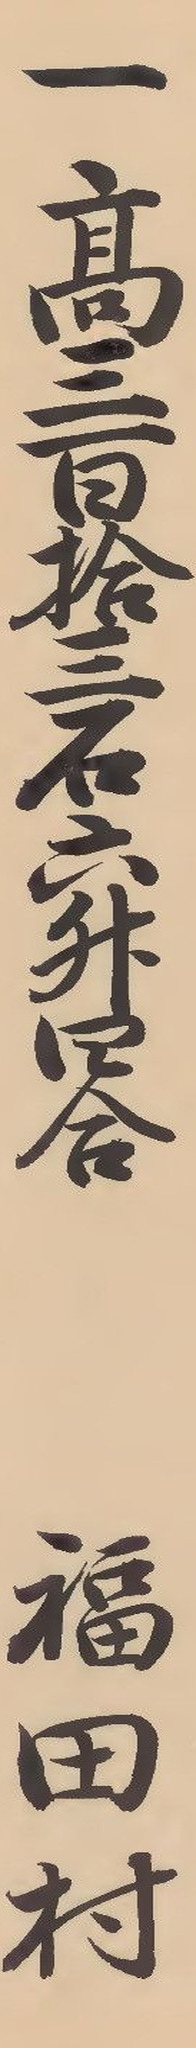一高三百拾三石六升四合福田村
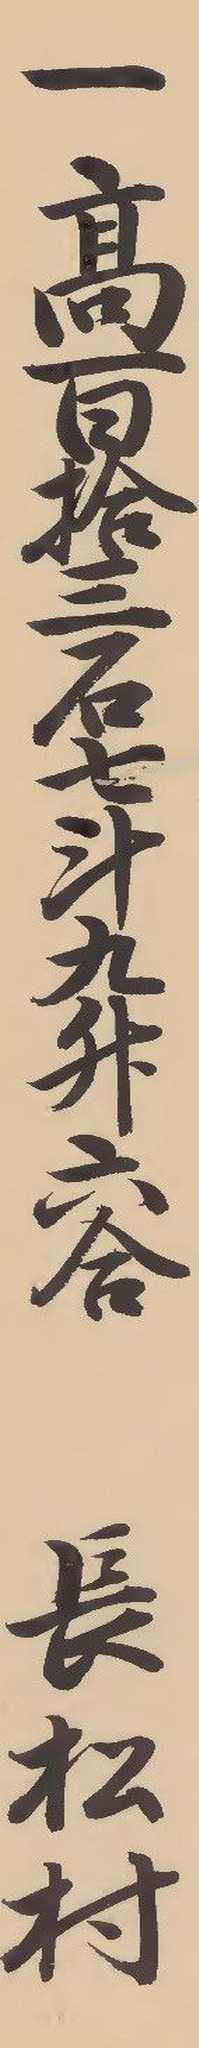一高百拾三石七斗九升六合長松村

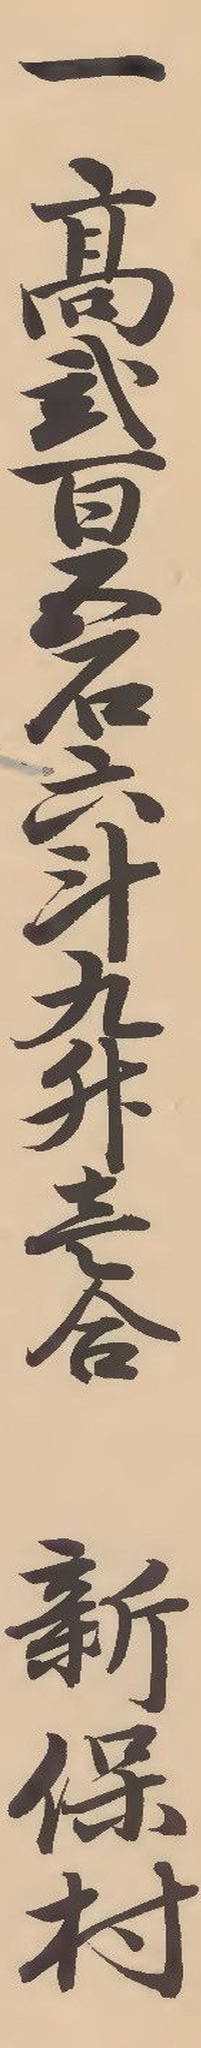一高弐百五石六斗九升壱合新保村
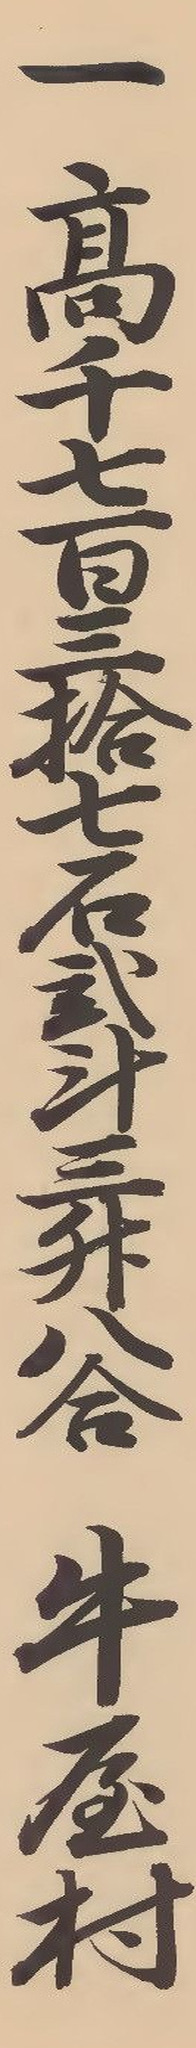一高千七百三拾七石弐斗三升八合牛屋村
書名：越後国郷帳　下
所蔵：国立公文書館 National Archives of Japan
